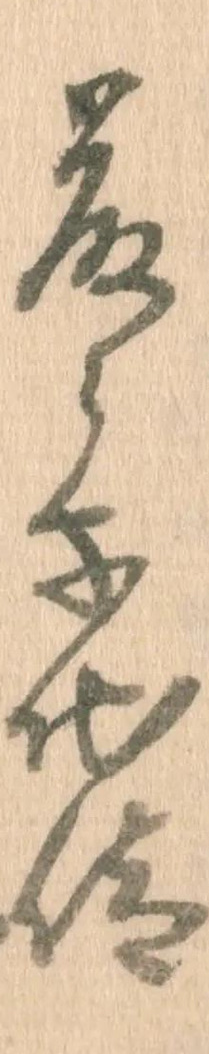藤兵衛地借
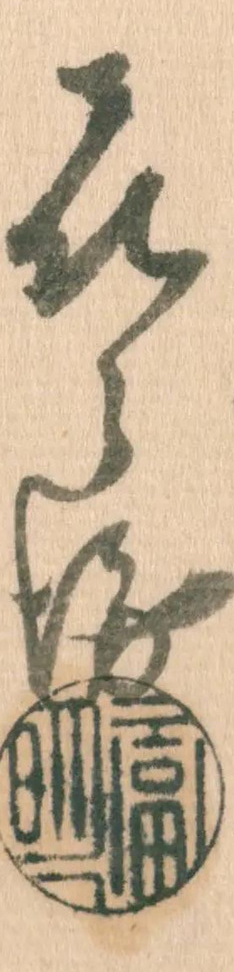喜兵衛㊞
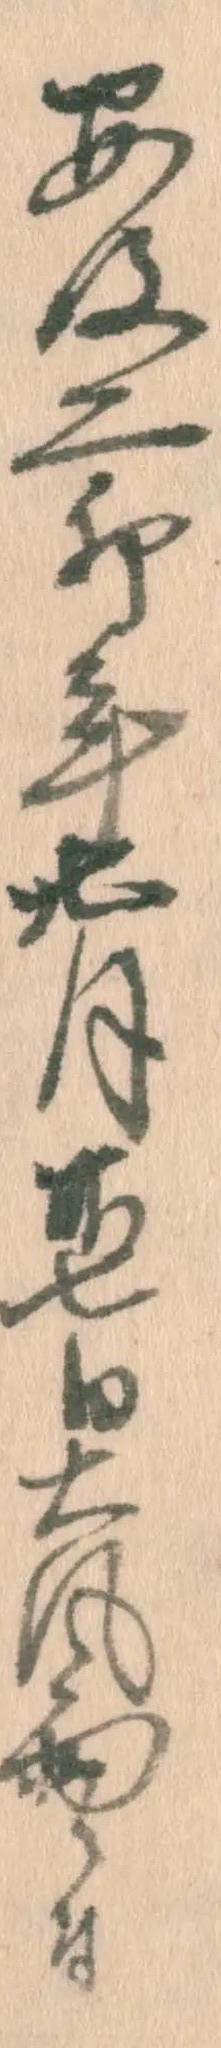安政二卯年七月廿七日大風雨ニ付
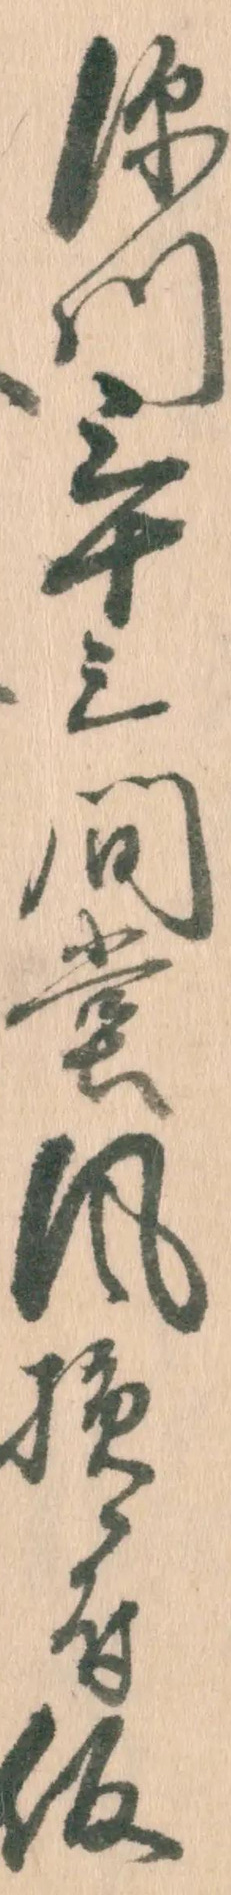深川三十三間堂風損ニ付仮
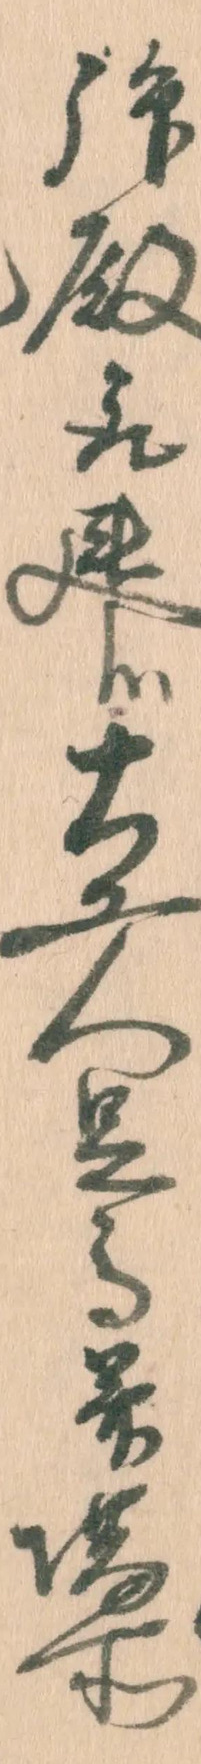拝殿取建候大工人足高幷場所
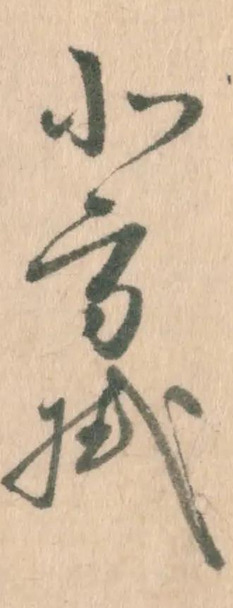北方掛

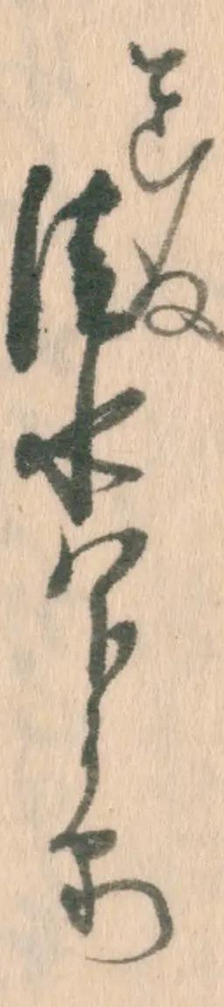清水八郎兵衛
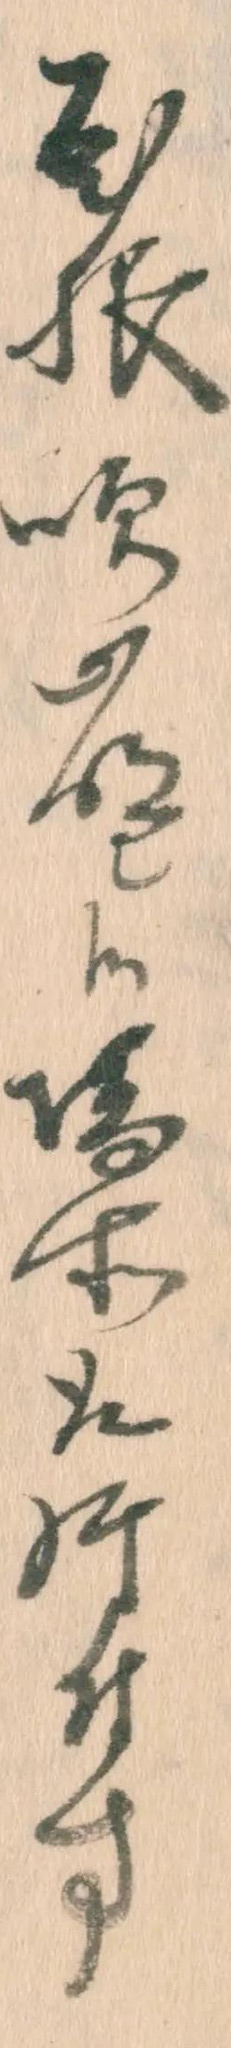屋根吹崩レ候場所取片付方
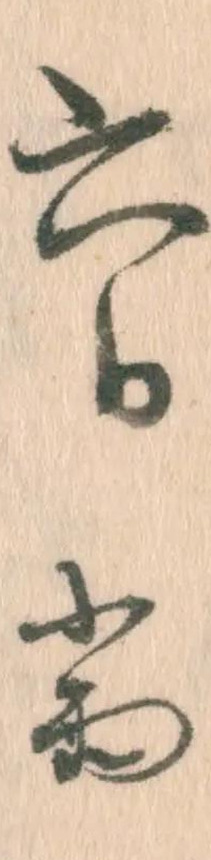六日小雨
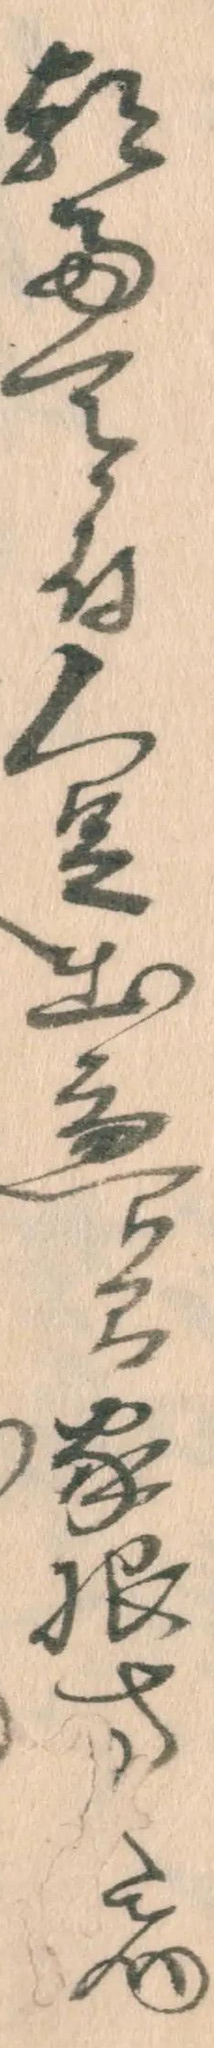朝雨天ニ付人足出兼候間家根方之者
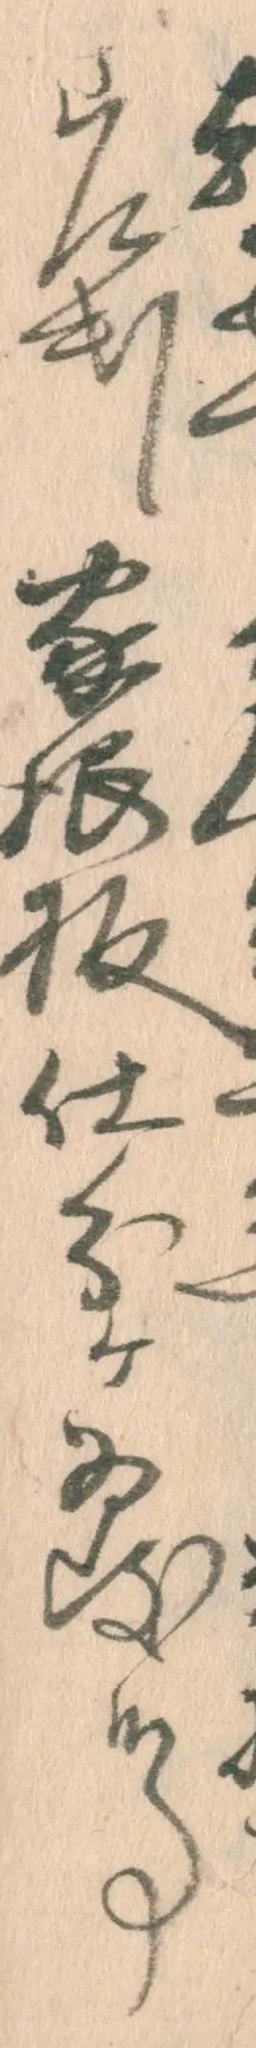差出し家根板仕分ケ為致候事

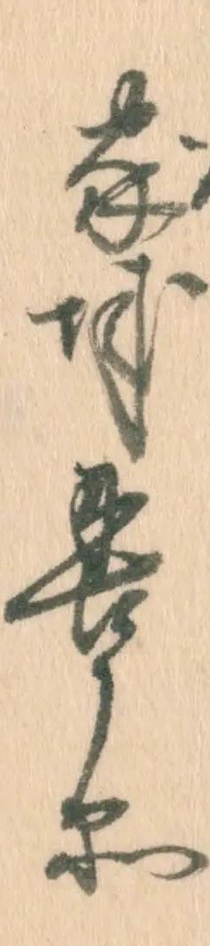家城善兵衛
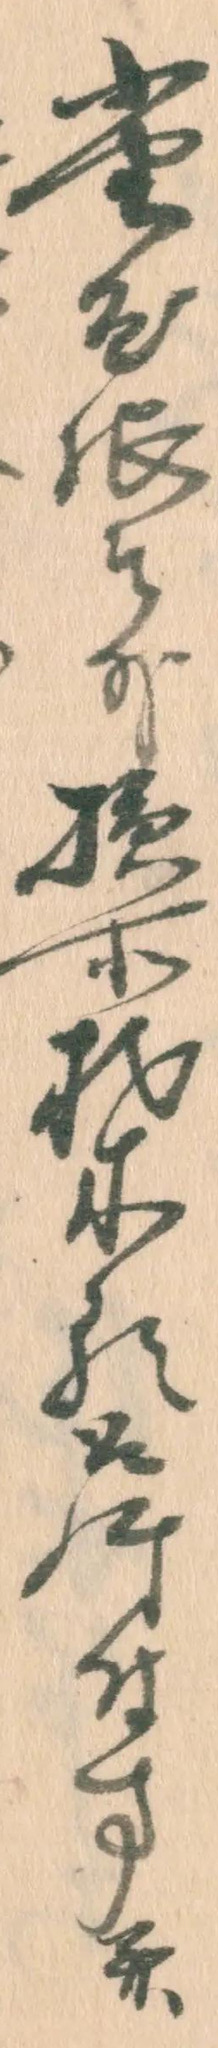堂屋根其外損所材木類取片付方幷
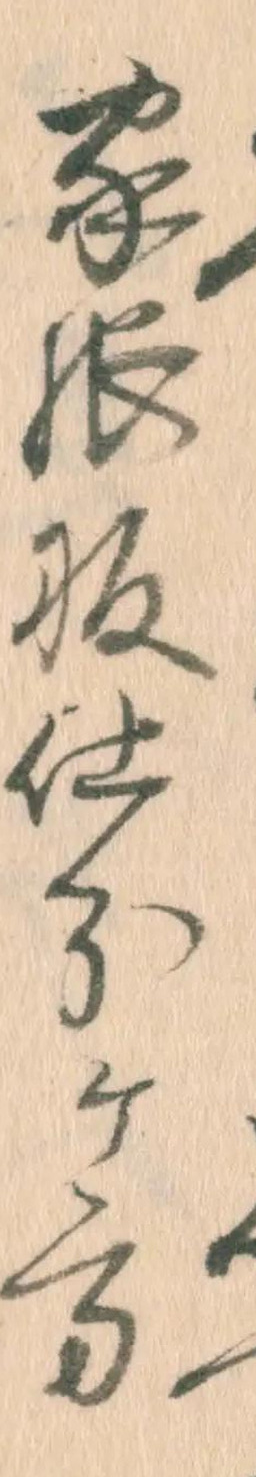家根板仕分ケ方
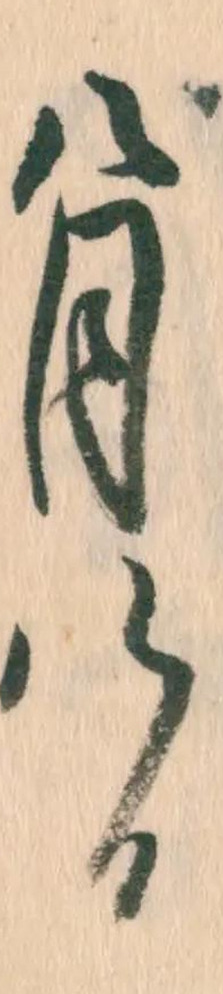八月八日
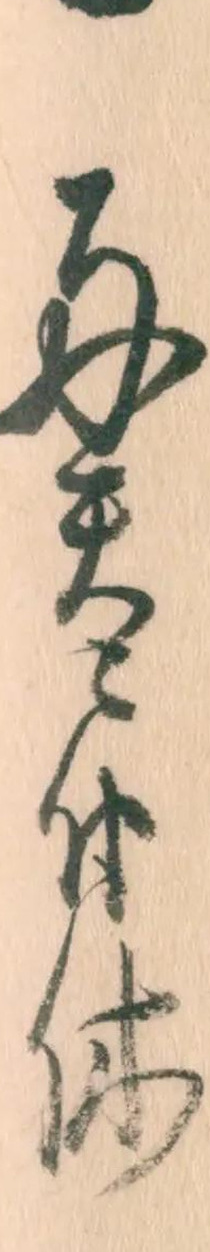一雨天ニ付休
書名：三十三間堂. [2]
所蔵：国立国会図書館 National Diet Library, JAPAN
